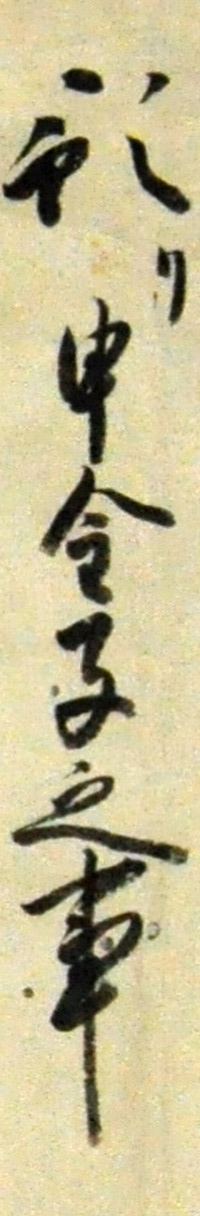預り申金子之事
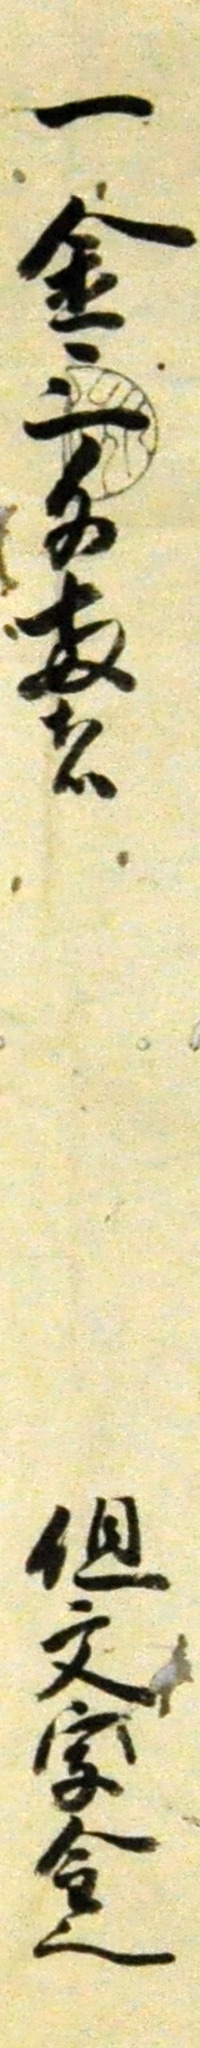一金三千両は但文字金也
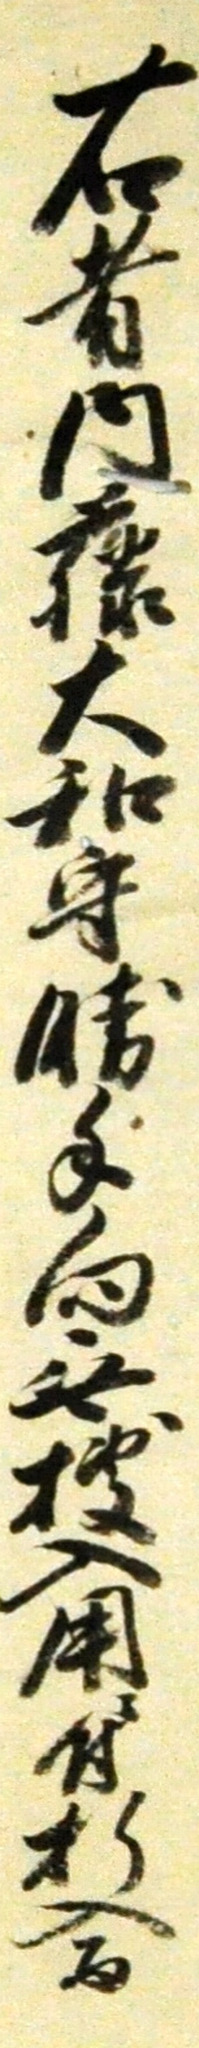右は内藤大和守勝手向無拠入用に付折入て
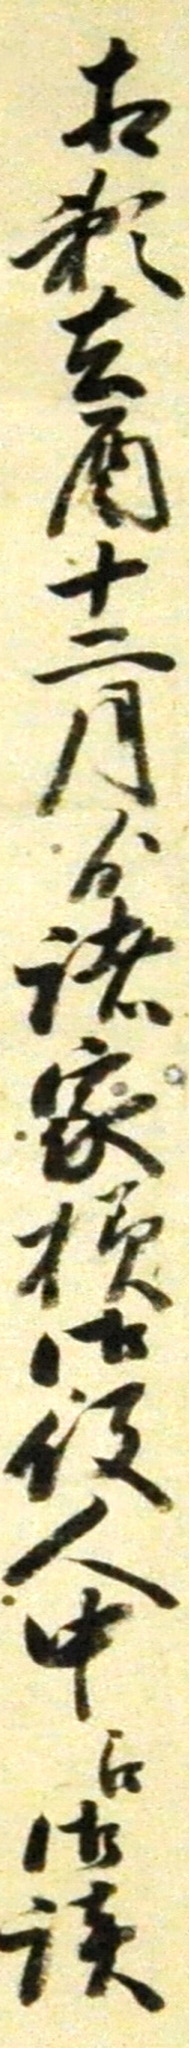相頼去酉十二月ゟ諸家様御役人中え御談
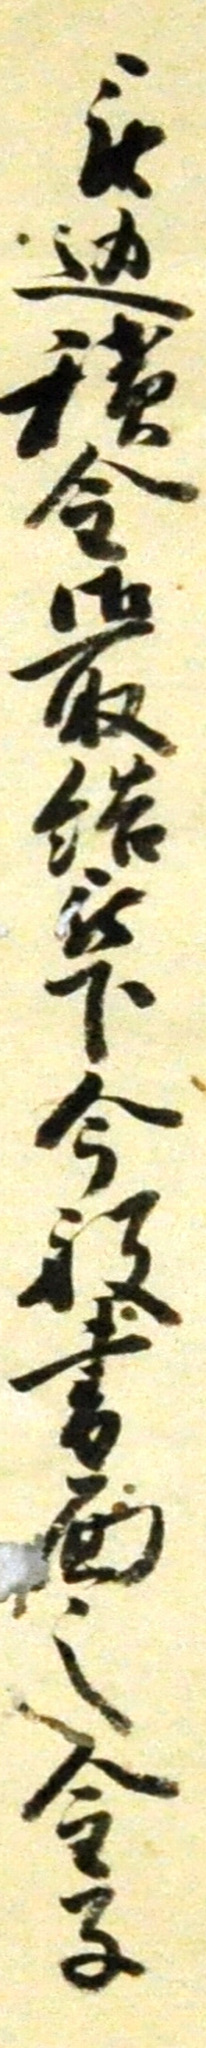被込積金御取繕被下今般書面之金子
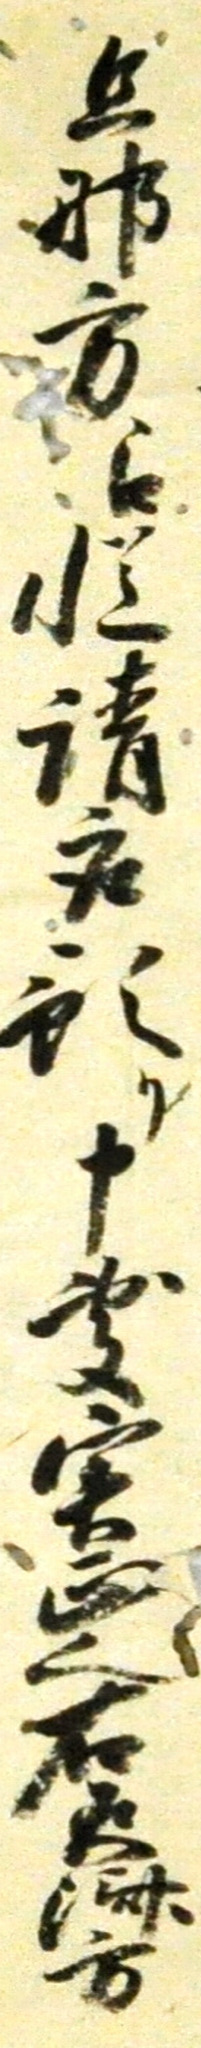旦那方え慥請取預り申処実正也右返済方
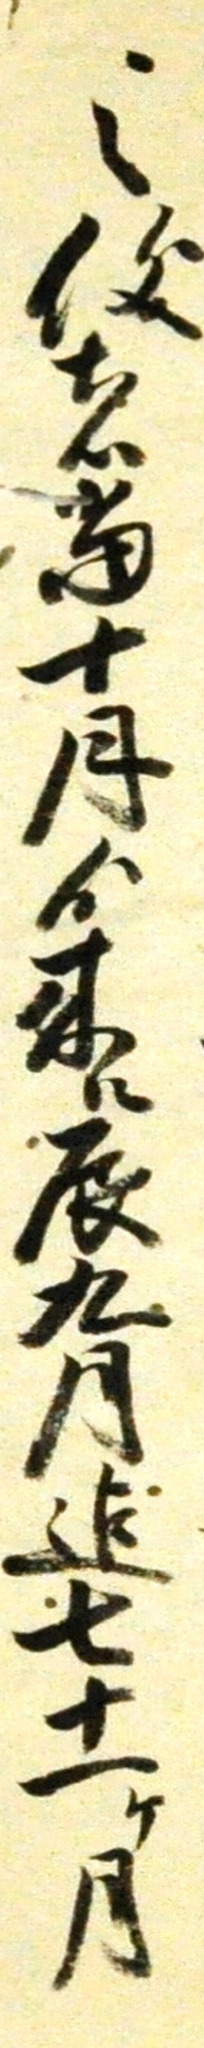之儀は当十月ゟ来ル辰九月迄七十一ヶ月
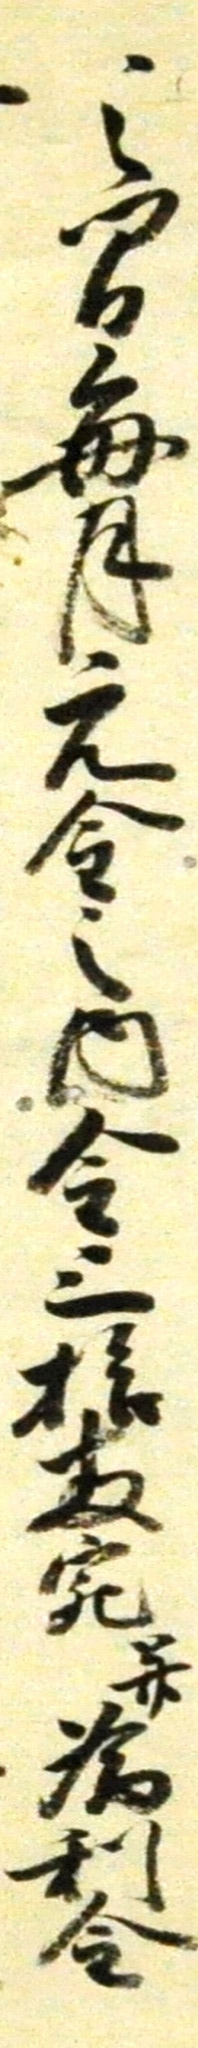之間毎月元金之内金三拾両宛并為利金
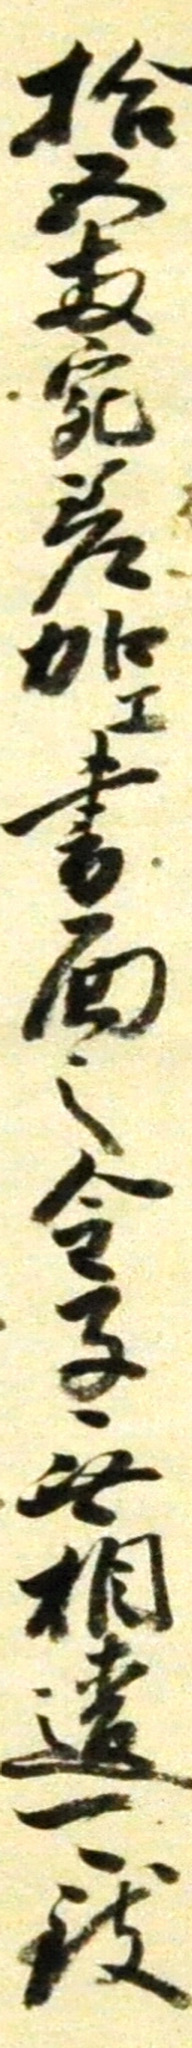拾五両宛差加ェ書面之金子無相違可致
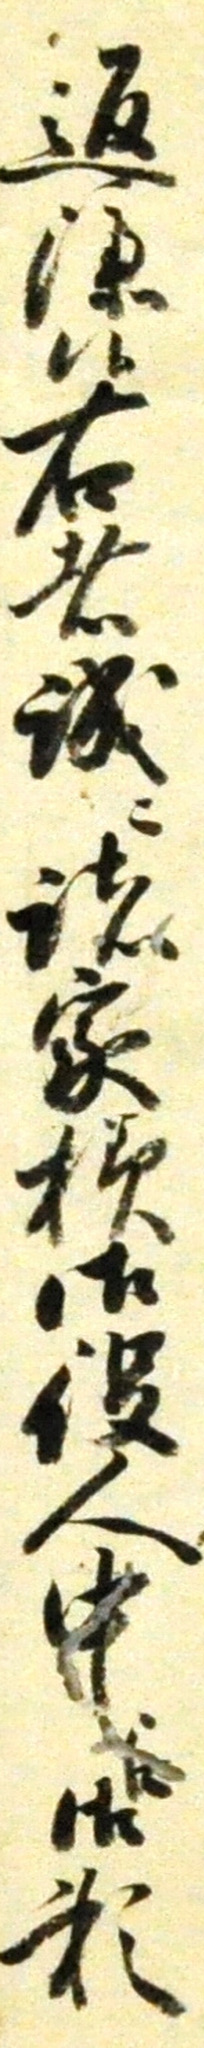返済候右は誠に諸家様御役人中え御頼
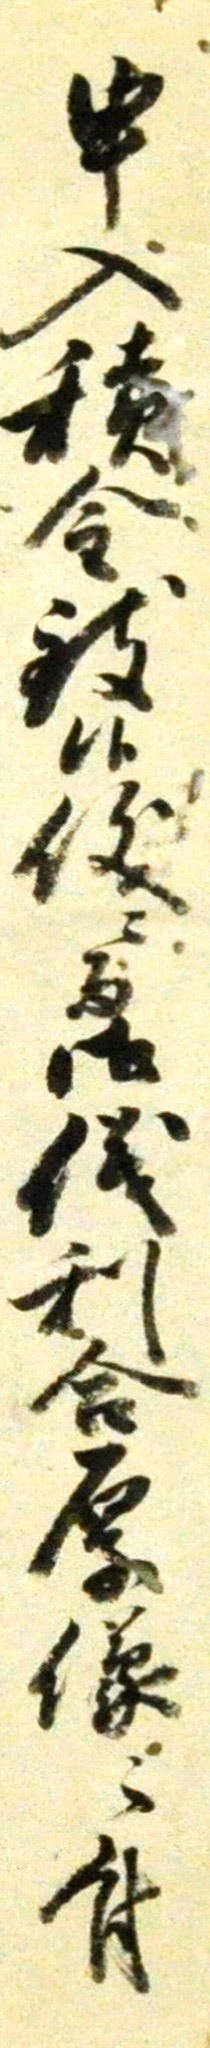申入積金致候儀にて御儀利合厚儀に付
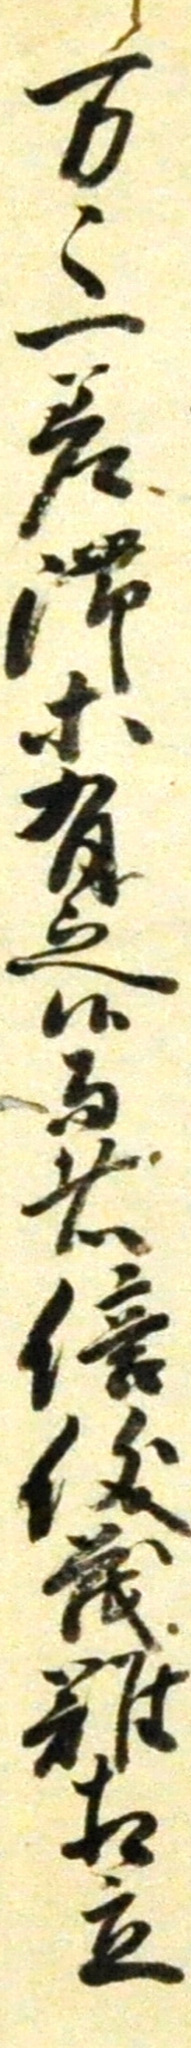万々一差滞等有之候ては信儀も難相立
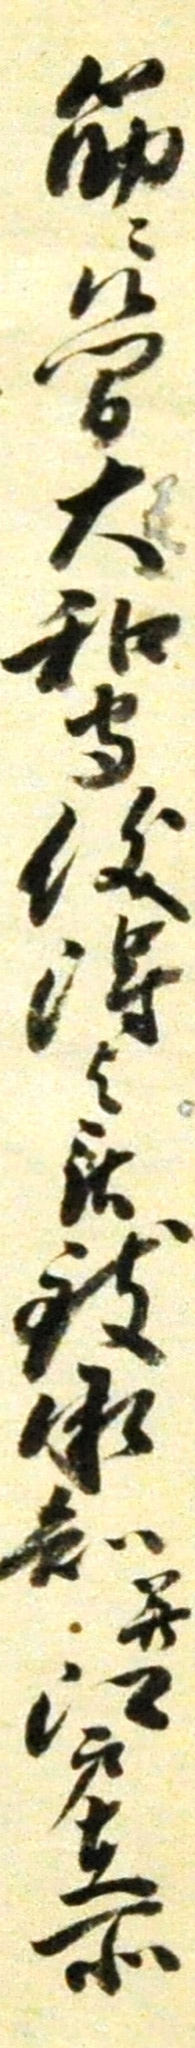筋に候間大和守儀得と被致承知并江戸在所
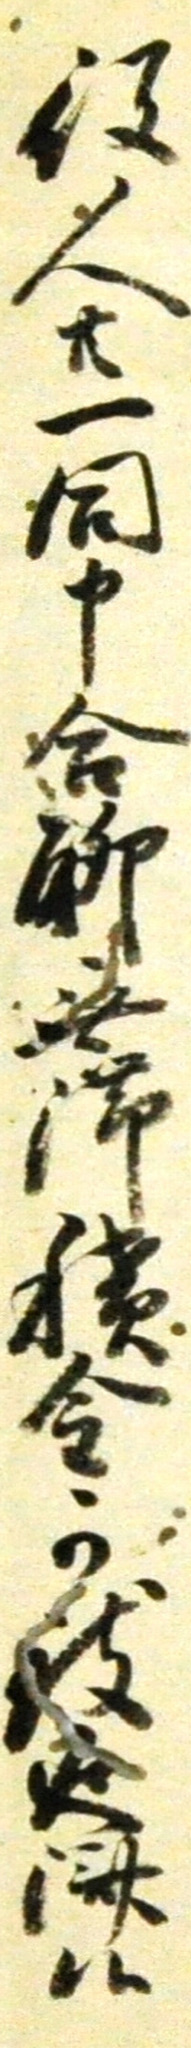役人共一同申合聊無滞積金可致返済候
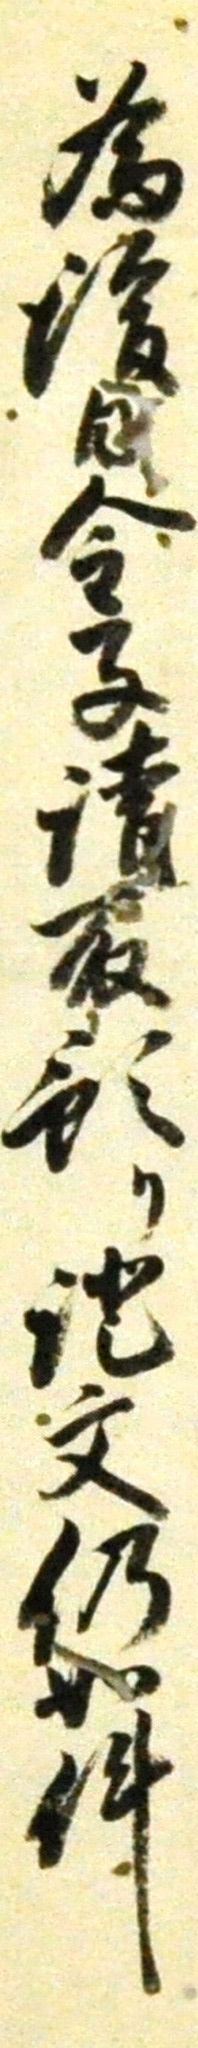為後日金子請取預り証文仍如件
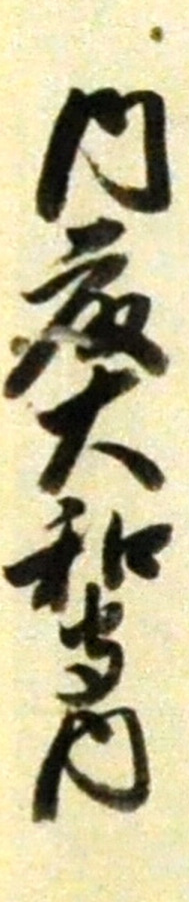内藤大和守内
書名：預り申金子之事
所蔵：伊那市立高遠町図書館・合同会社AMANE
